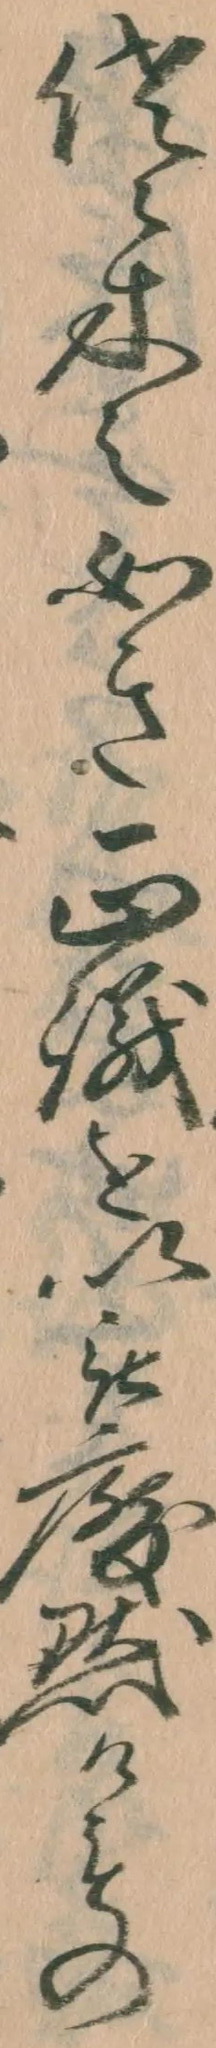佐々木之如き正議を以て被廃黙候もの
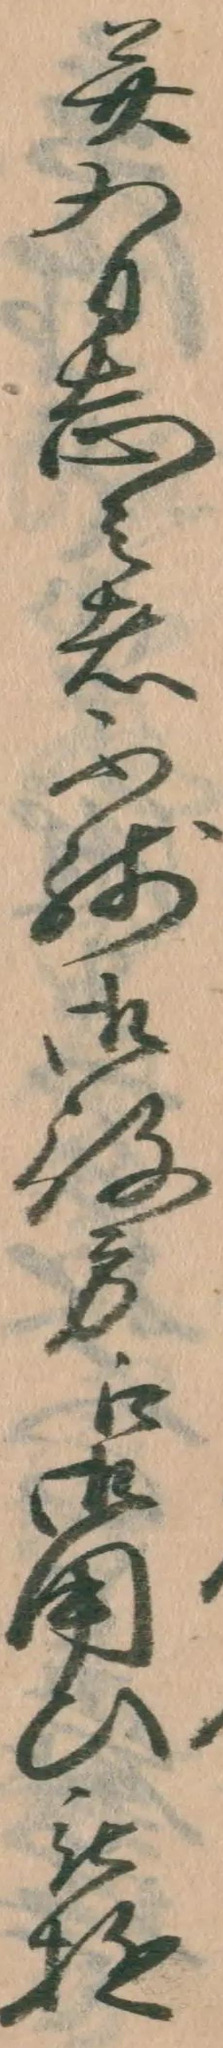幷有志之者不残御役方え御用ひ被遊
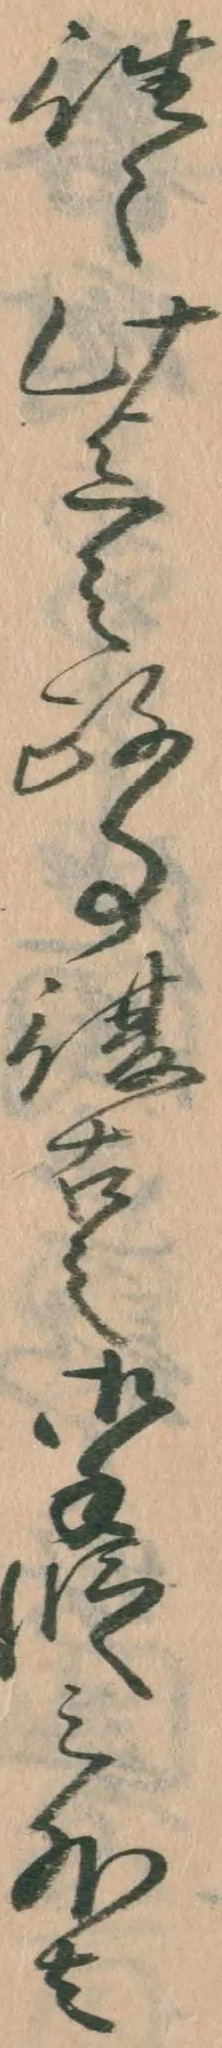往々此迄之政治復古之御手段之外者
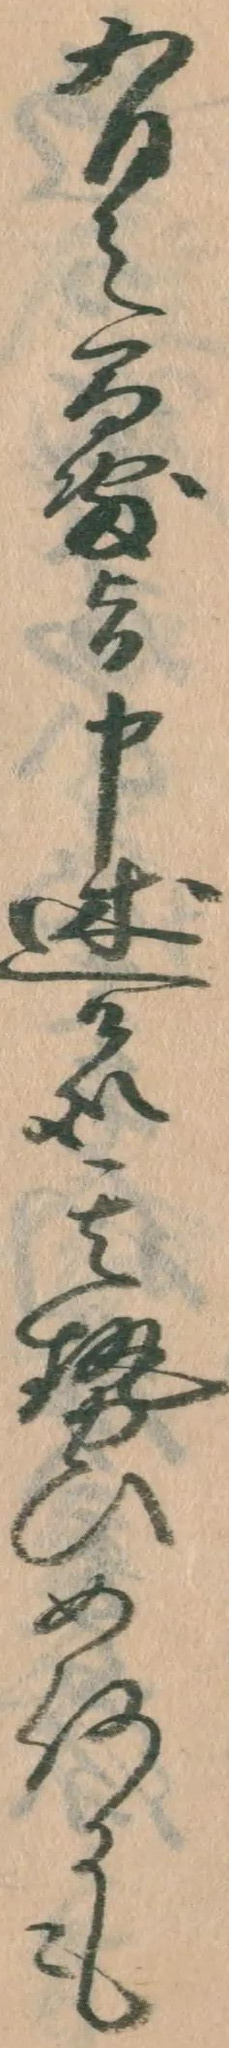有之間敷旨申述候処其勢ひ如何にも
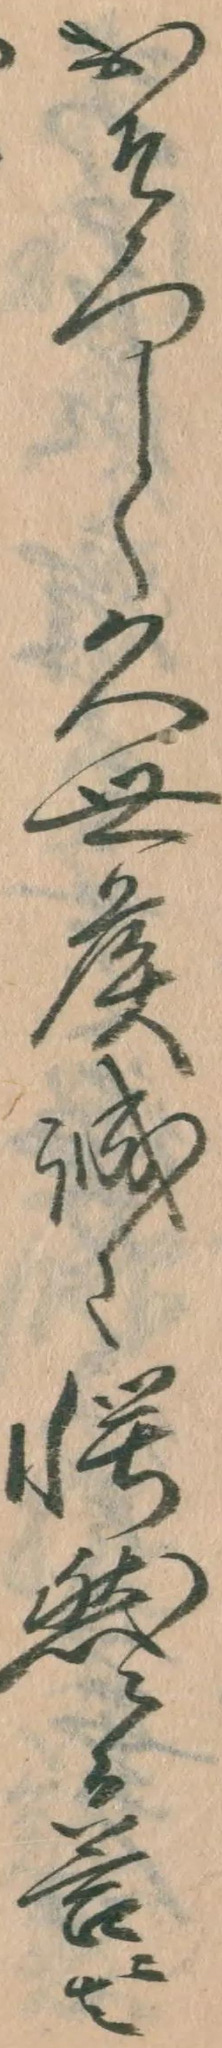おそろしく久世侯誠ニ愕然ニ而答ニ者
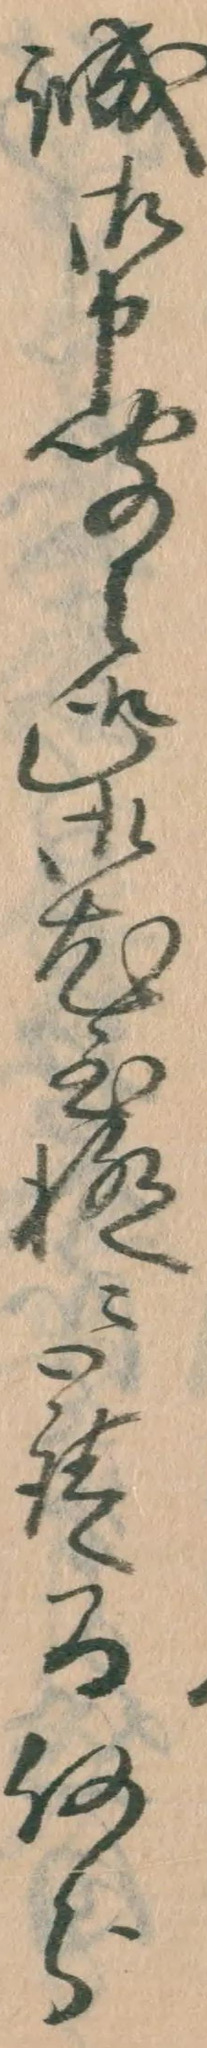誠御申聞之趣御尤至極ニ御座候間何分
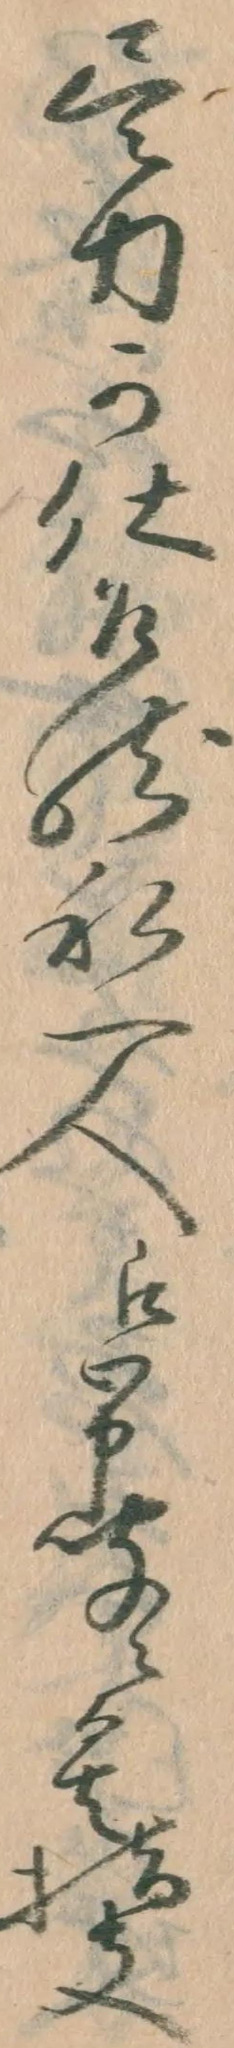尽力可仕乍然私一人え御申聞ニ而者指支
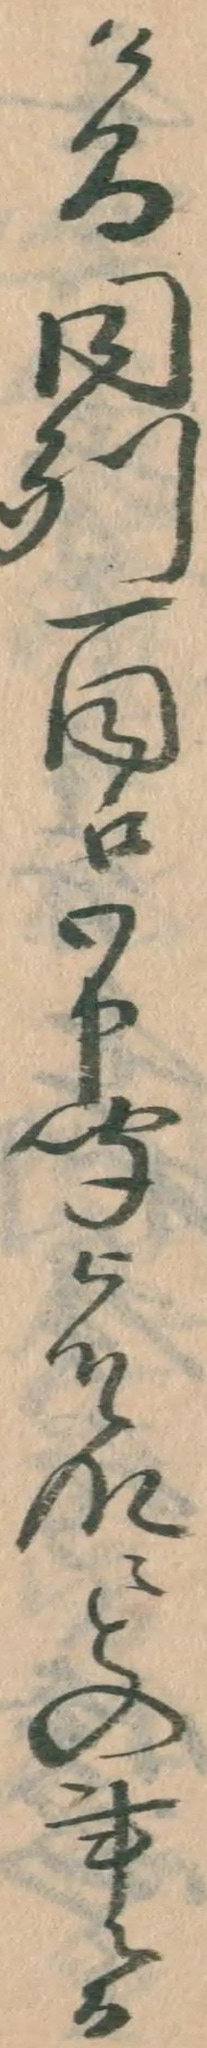候間同列一同え御申聞被下候様ニとの事ニ而
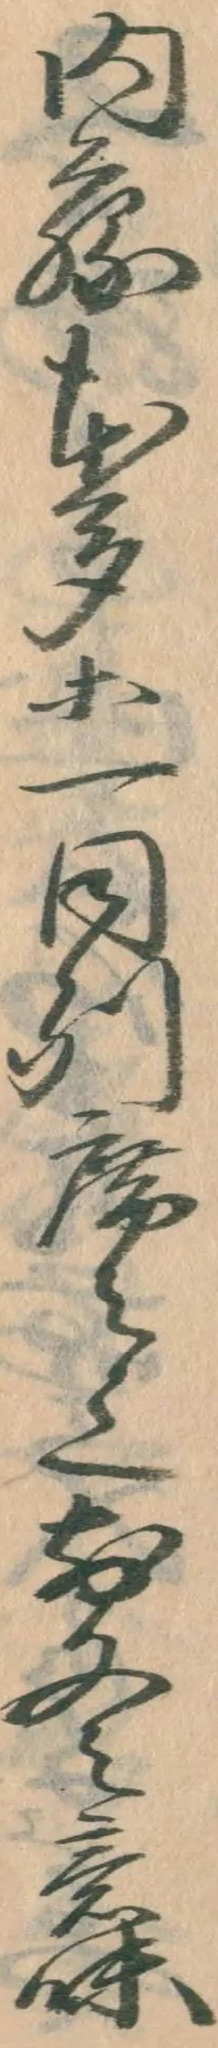内藤本多等一同列席之上前文之意味

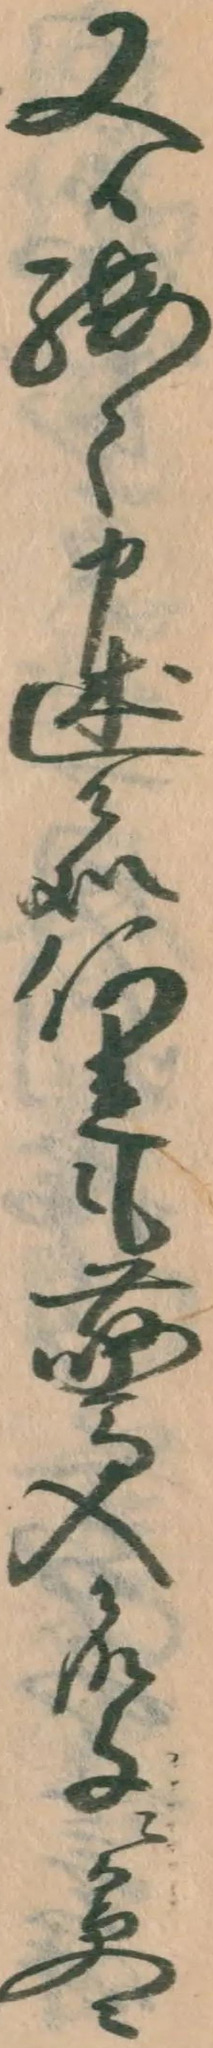又ハ縷々申述候処何れも驚入候様子ニ而更ニ
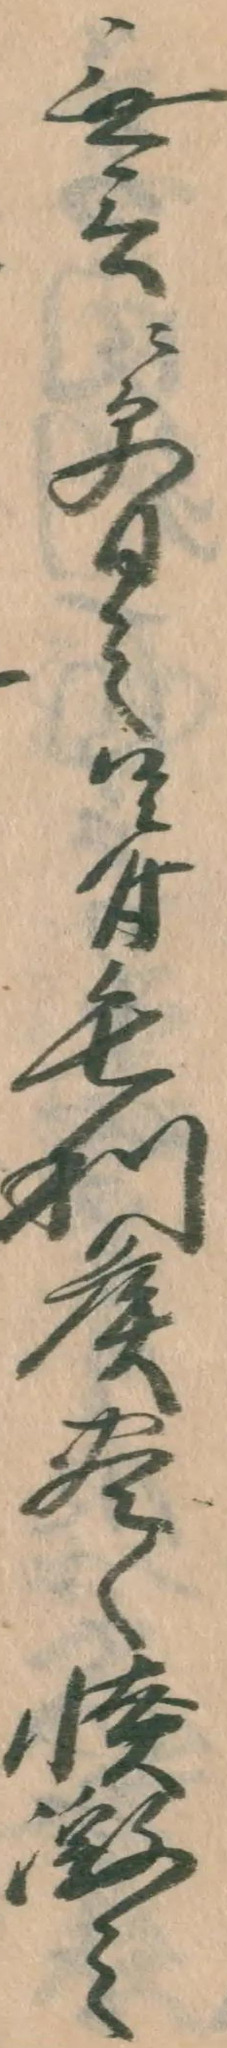無言ニ而有之候ニ付毛利侯盡く憤激之
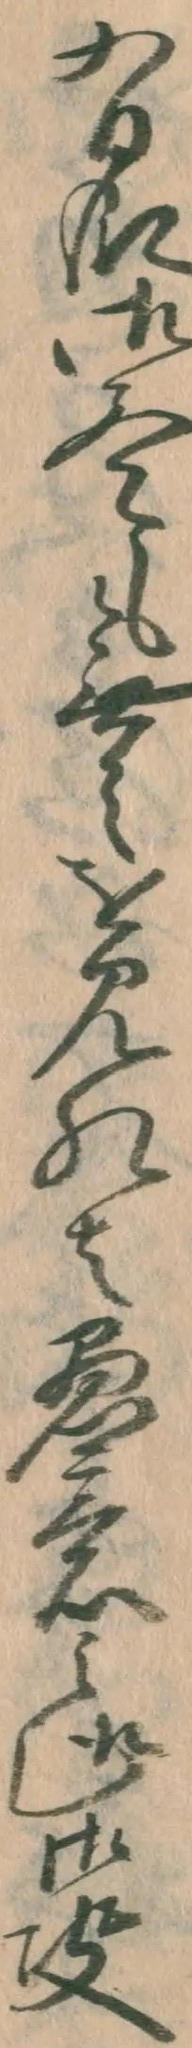有様御答も無之を見れは愚意之趣御決
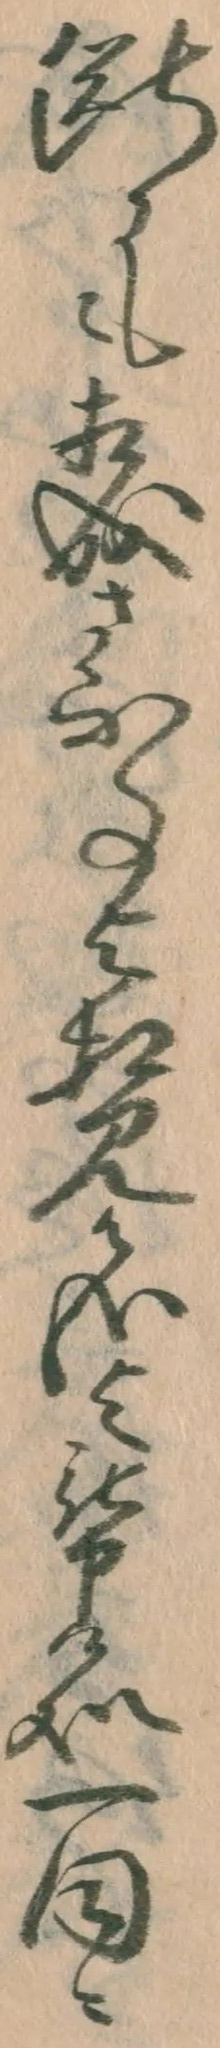断にも相成さる事と相見候哉と被申候処一同ニ
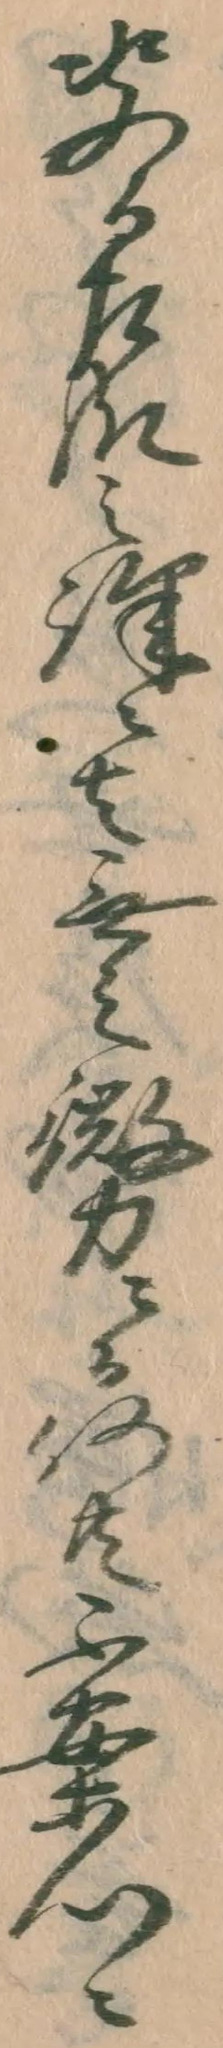決而左様之譯ニ者無之微力ニ而何共不案心ニ
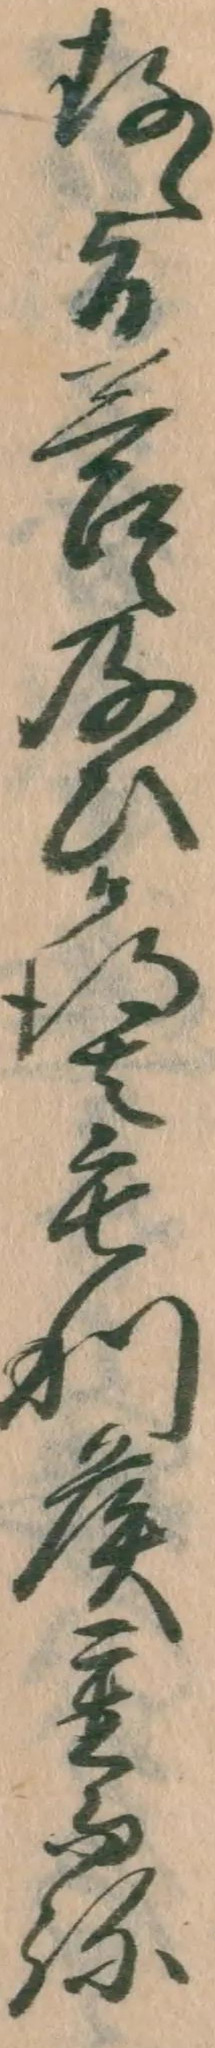存候旨答ニ及ひ候得者毛利侯重而弥
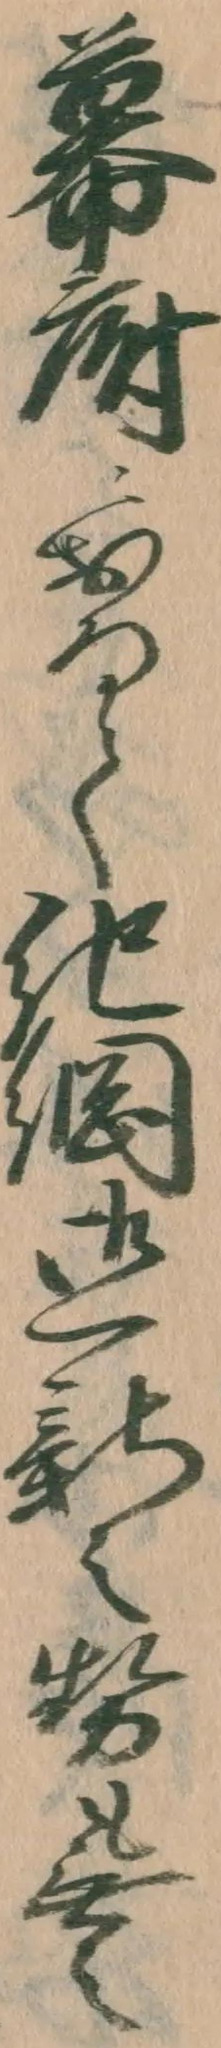幕府ニおゐて紀綱御一新之勢も無之
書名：麗斎叢書. 20
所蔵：国立国会図書館 National Diet Library, JAPAN
